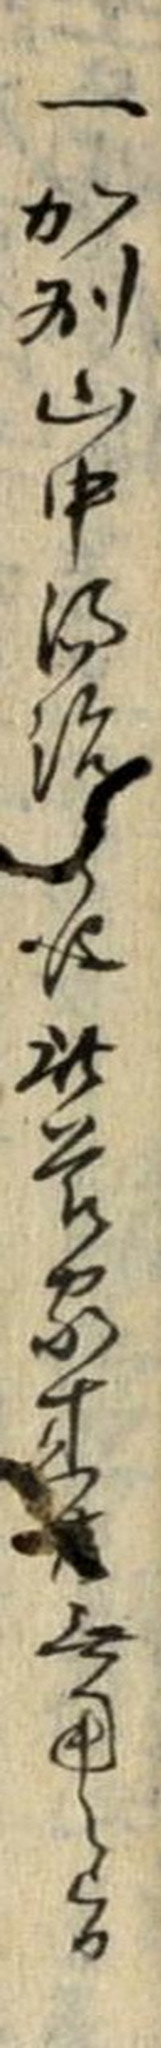一加州山中湯治儀此節家来共無用之旨
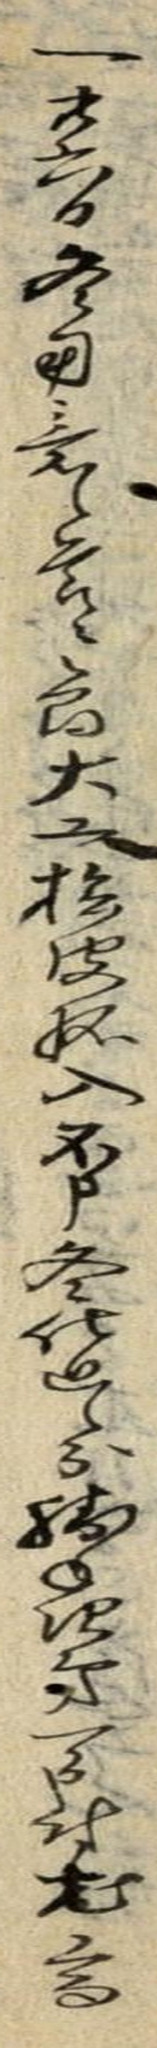一廿六日冬用意之節に候間大工檜皮抔入不申冬仕廻之義勝手次第可申付尤高
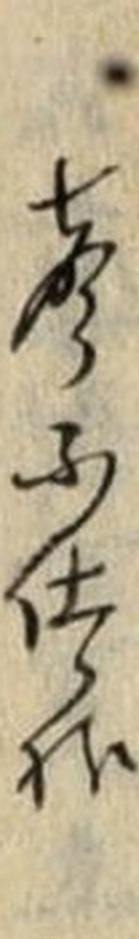声不仕候様
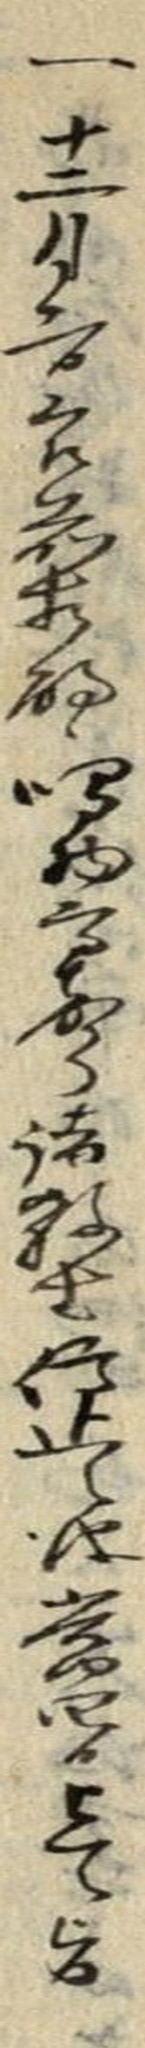一十二月二日最前相触候鳴物高声諸殺生停止之儀当四日迄之旨
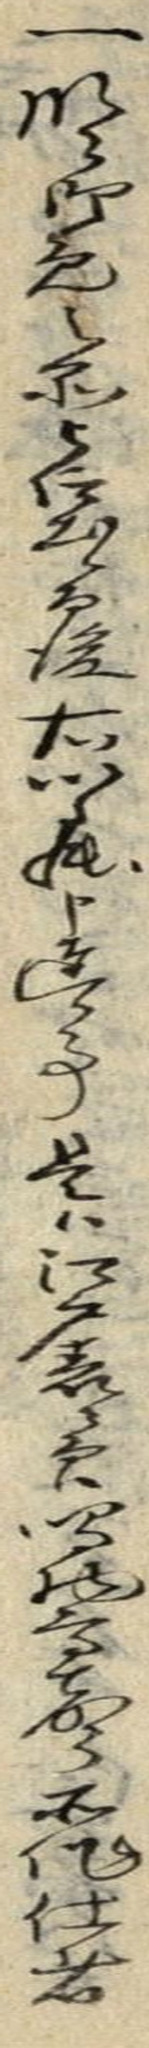一段々御免之品被仰出候て後右以手紙申達候事是は江戸表にては鳴物高声所作仕者
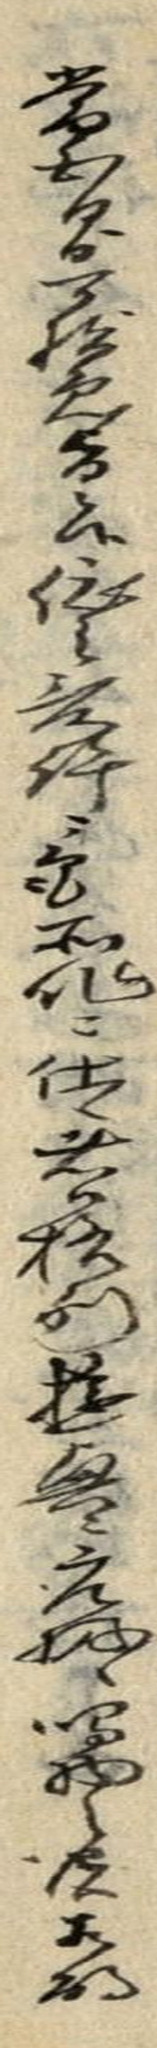当五日ゟ可指免旨に候依之爰許にても所作に仕候者は格別遊興に取扱候鳴物之儀は相触
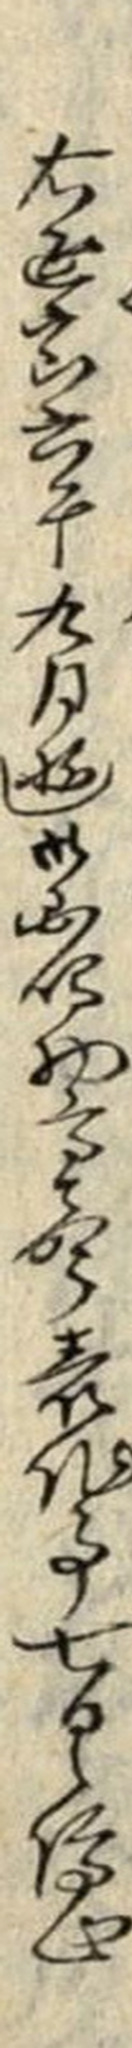右延宝六午九月逝御国鳴物高声表作事七日之停止
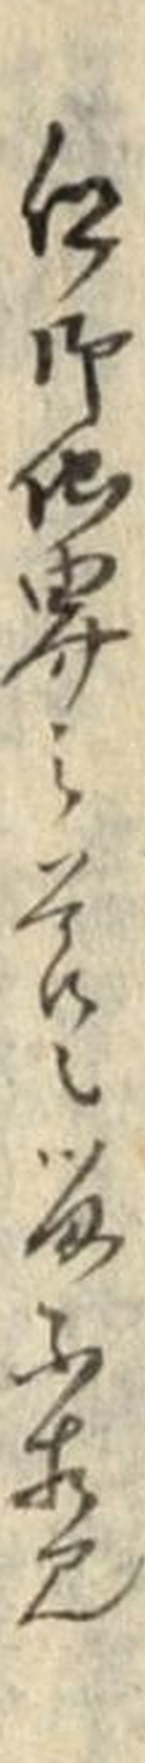但御他界之節之留不相見
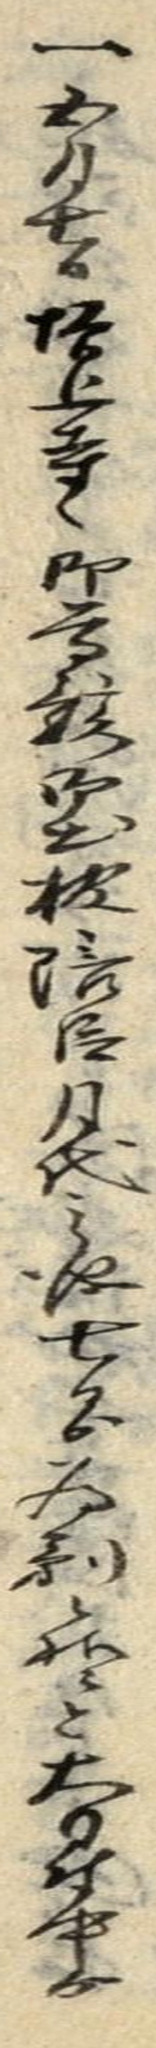一五月七日増上寺へ御尊骸御出棺陪臣月代之儀七日ゟ為剃候様にと大目付中ゟ
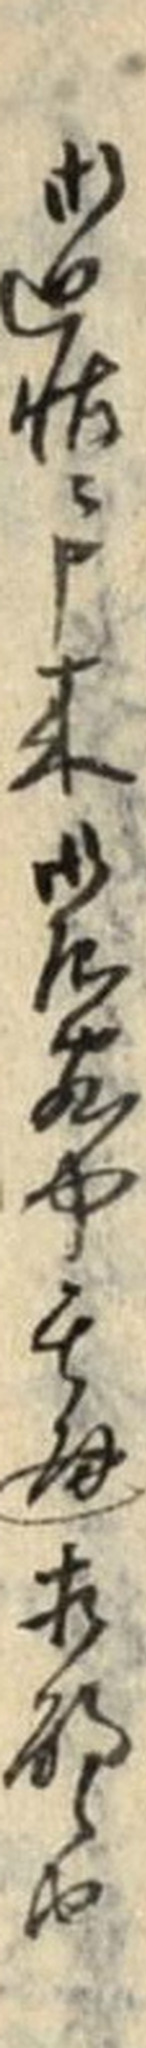御廻状に申来御屋敷中其通相触候由
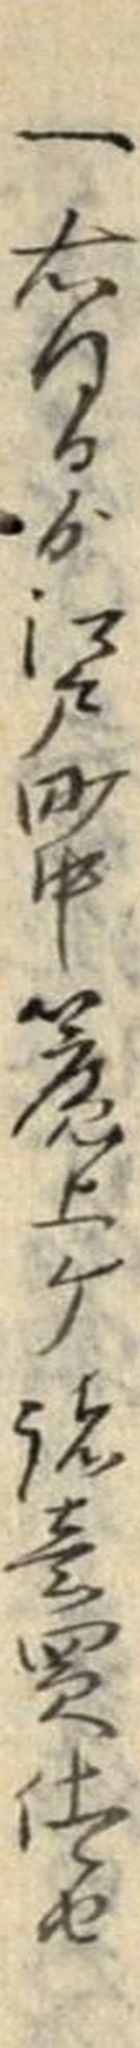一右同日ゟ江戸町中簾上ケ諸商売仕候由
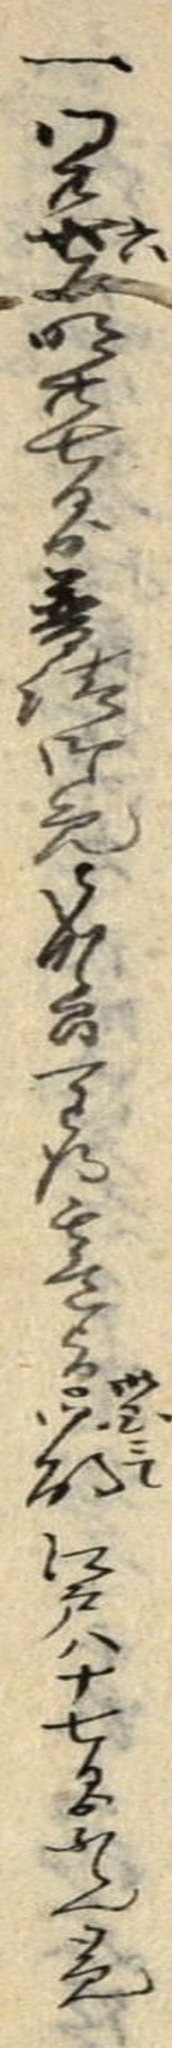一同廿六日明廿七日ゟ普請御免被成候間可被得其意旨◦御触御国にて江戸は十七日ゟふしん御免

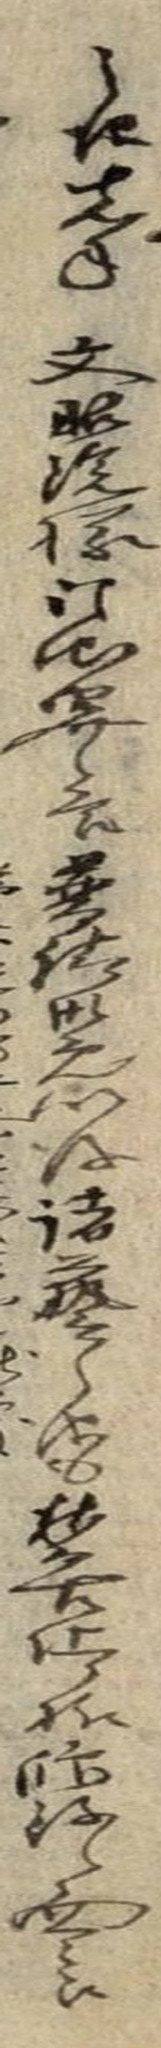之儀先年文昭院様御他界之節普請御免以後諸芸之儀も稽古止候様師役之面々え
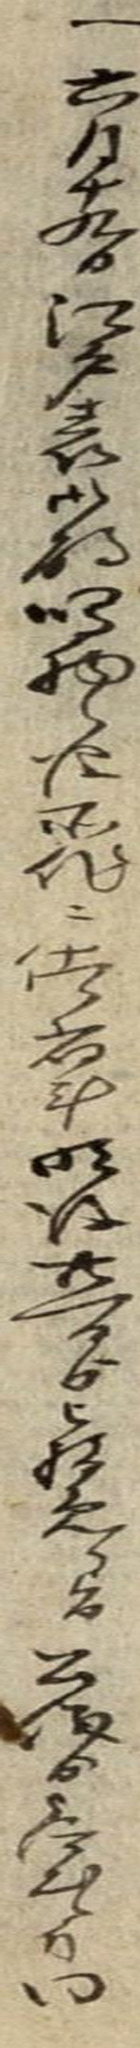ハ一六月十九日江戸表御触鳴物之儀所作に仕候者斗明後廿一日ゟ被指免候旨公儀ゟ被仰出候付同
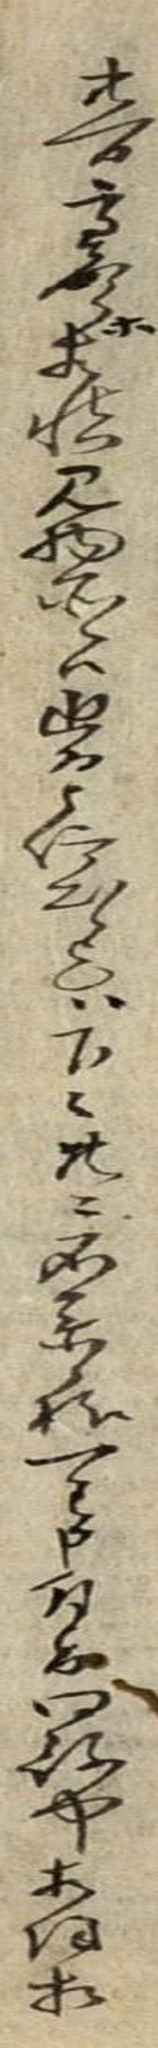廿一日高声等相慎見物所へは追て被仰出候迄は下々共に不参候様可被申付旨同役中相伺相
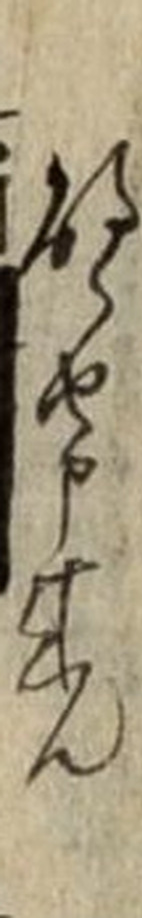触候由申来る
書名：御停止異変死失
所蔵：福井県文書館 Fukui Prefectural Archives
